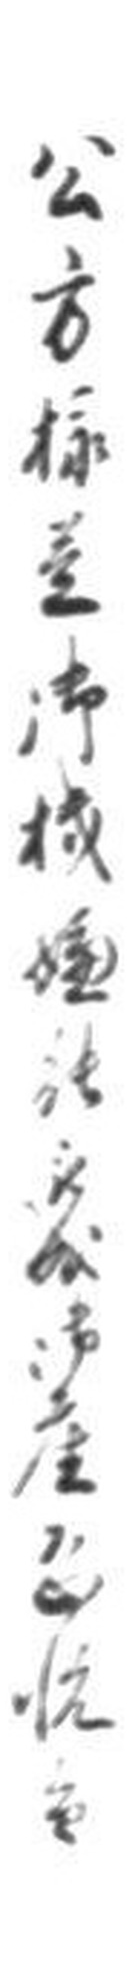公方様益御機嫌能被成御座恐悦旨
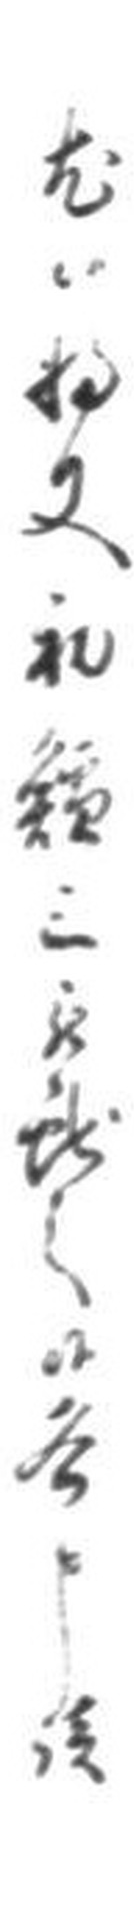尤候将又初鱈三被献之候各申談
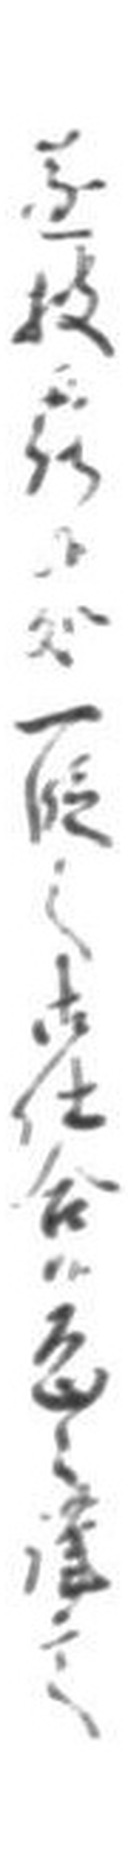遂披露候処一段之御仕合候恐々謹言
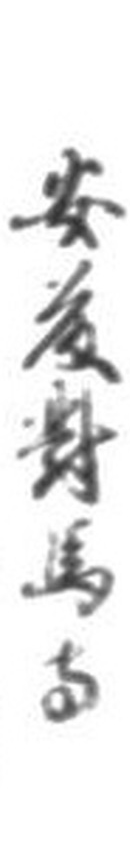安藤対馬守
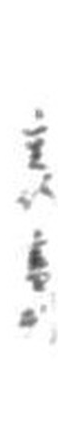重行書判
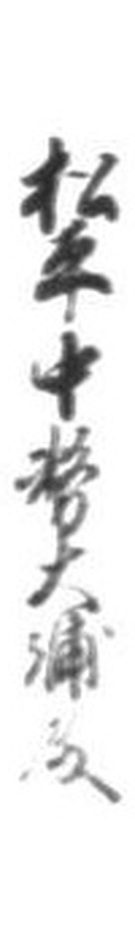松平中務大輔殿
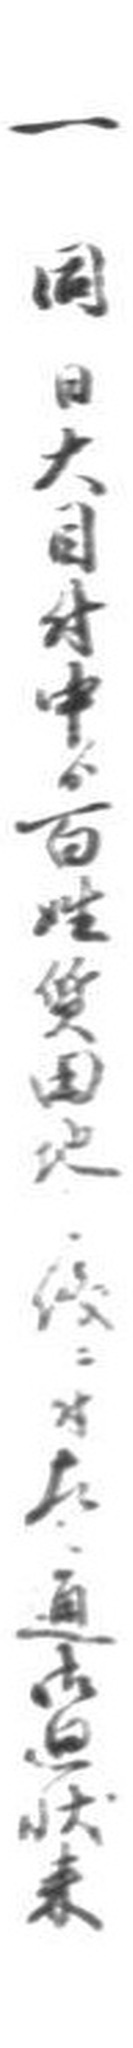一同日大目付中ゟ百姓質田地之儀ニ付左之通御廻状来
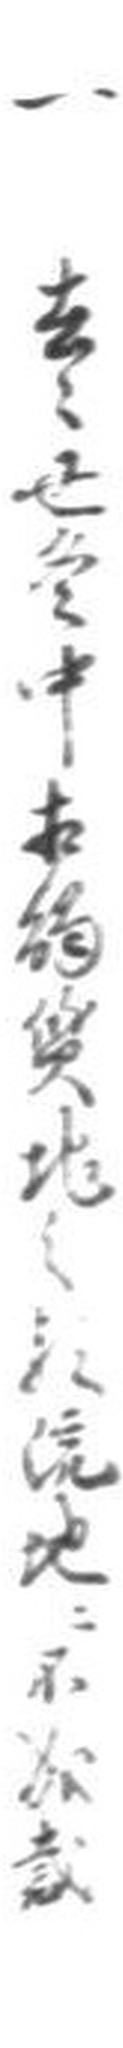一去々丑冬中相触質地之類流地ニ不成裁

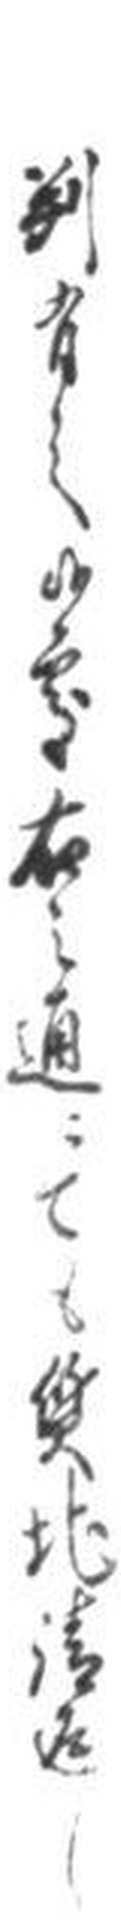判有之候処右之通ニても質地請返し候
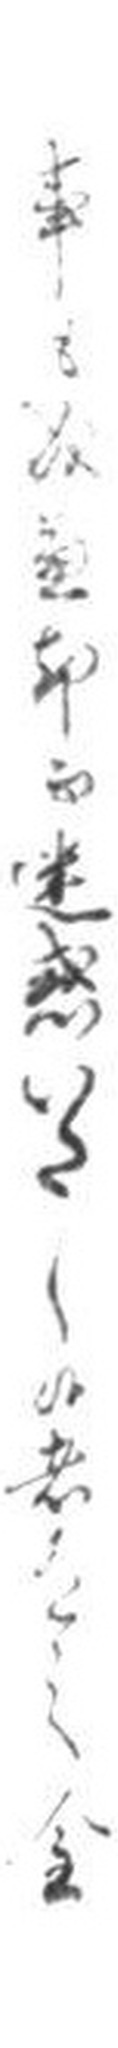事も成兼却而迷惑いたし候者有之金
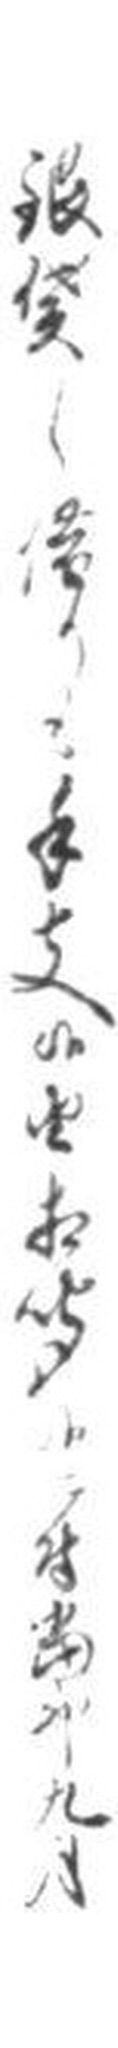銀貸し借りも手支候由相聞候ニ付当卯九月
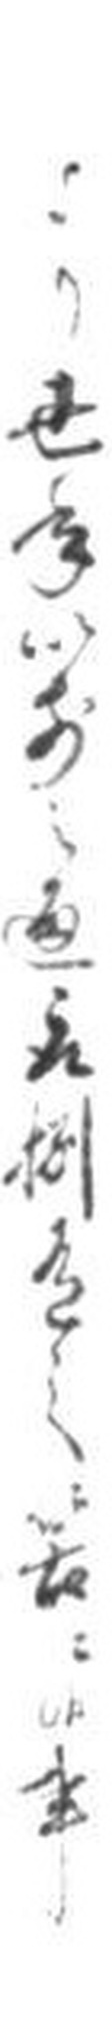より丑年以前之通取捌有之筈ニ候事
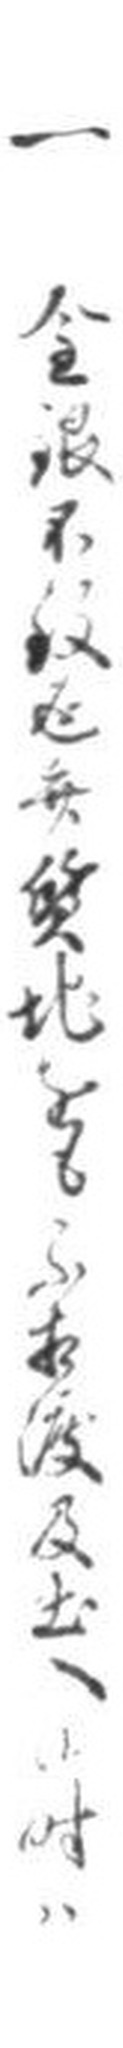一金銀不致返斉質地をも不相渡及出入候時ハ
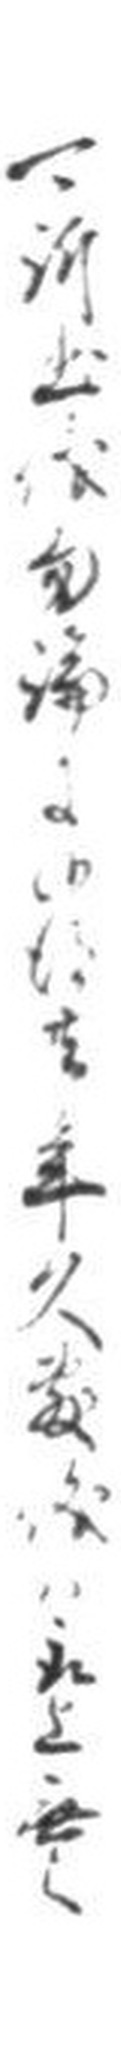可訴出儀勿論に候得共年久敷儀ハ取上無之
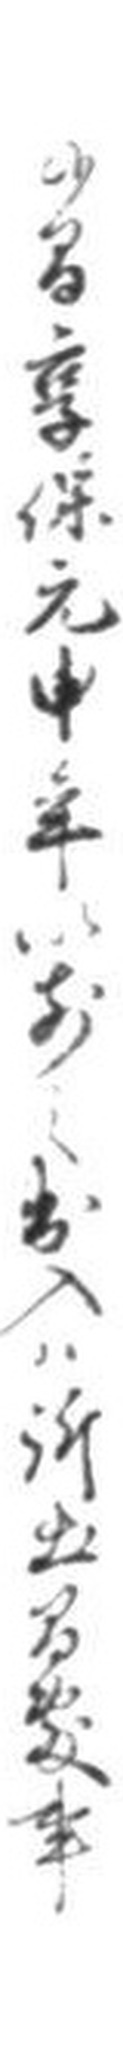候間享保元申年以前之出入ハ訴出間敷事
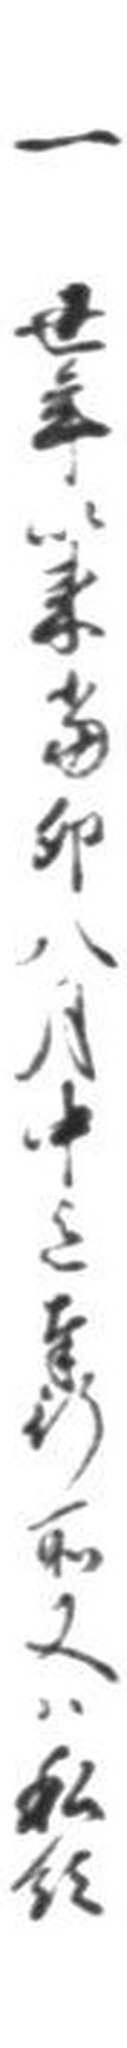一丑年以来当卯八月中迄奉行所又ハ私領
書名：家譜 三十六 宗昌公 従享保八年到同九年
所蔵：福井県文書館 Fukui Prefectural Archives
